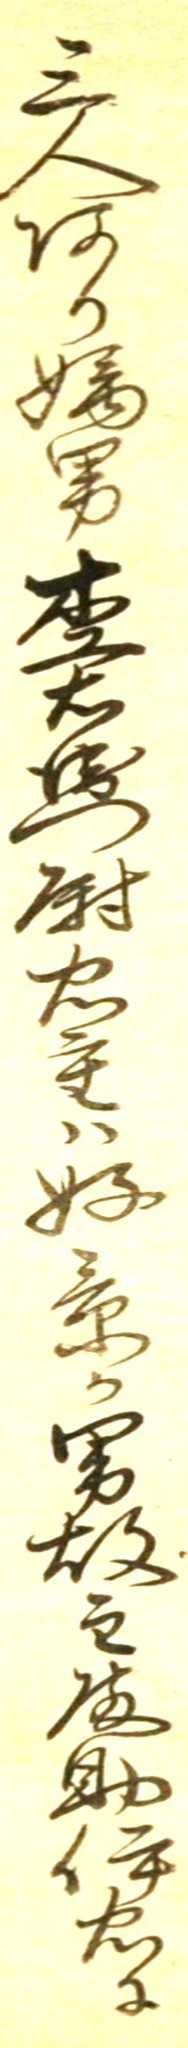三人あり嫡男杢右衛門尉忠重は好景か男故主殿助伊忠に
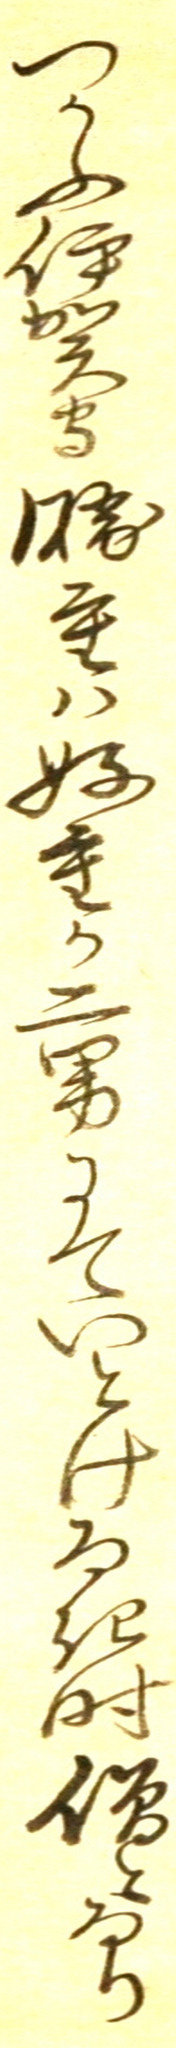つかふ伊賀守勝重は好重か二男にていとけなき時僧となり
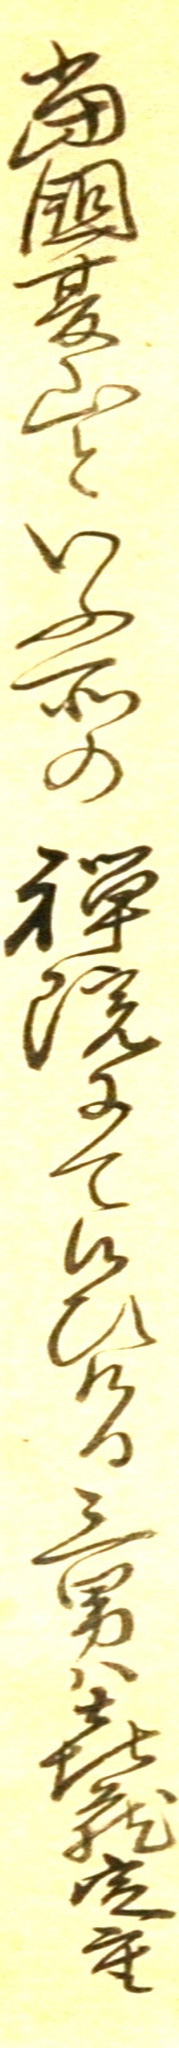当国夏山といふ所の禅院にて候ひける三男は喜蔵定重

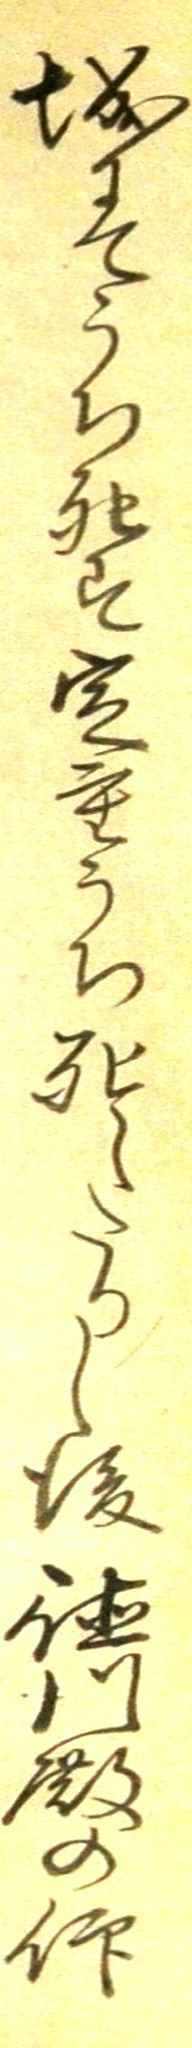城にてうち死す定重うち死したりし後徳川殿の仰
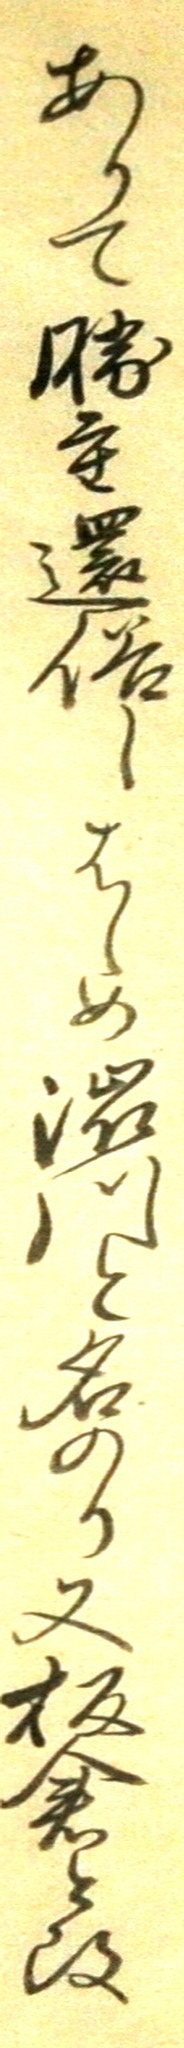ありて勝重還俗しはしめ渋川と名のり又板倉と改
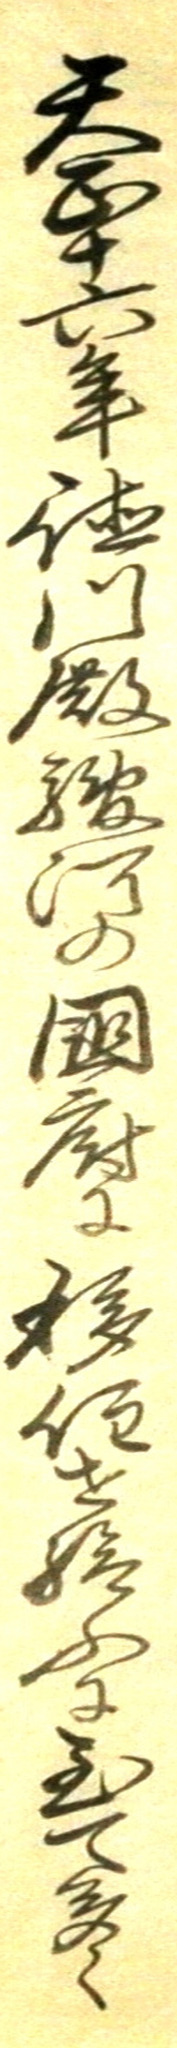天正十六年徳川殿駿河の国府に移住せ給ふに至て多く
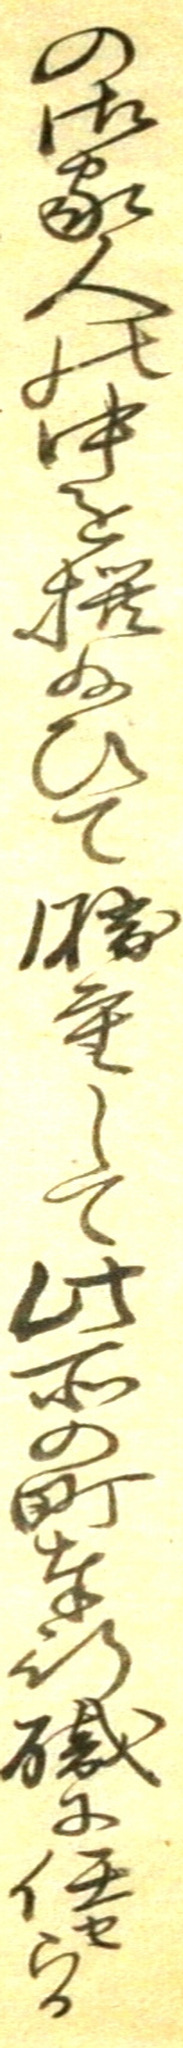の御家人の中を撰給ひて勝重して此所の町奉行職に任せらる

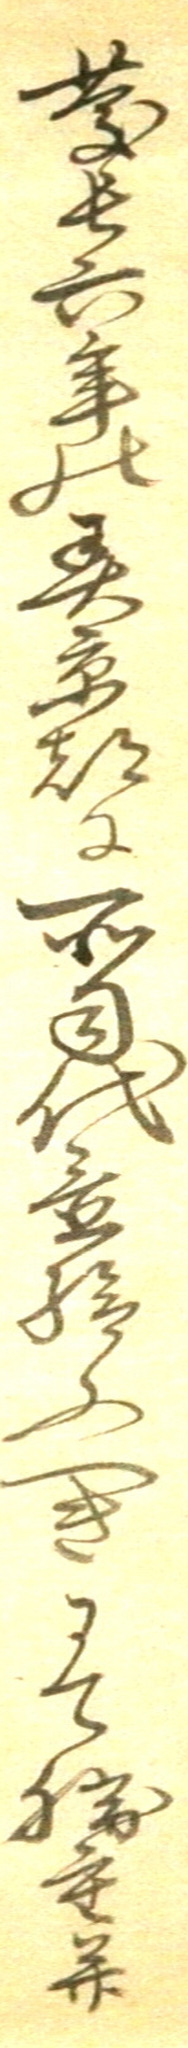慶長六年の春京都に所司代置給ふへきにて勝重并
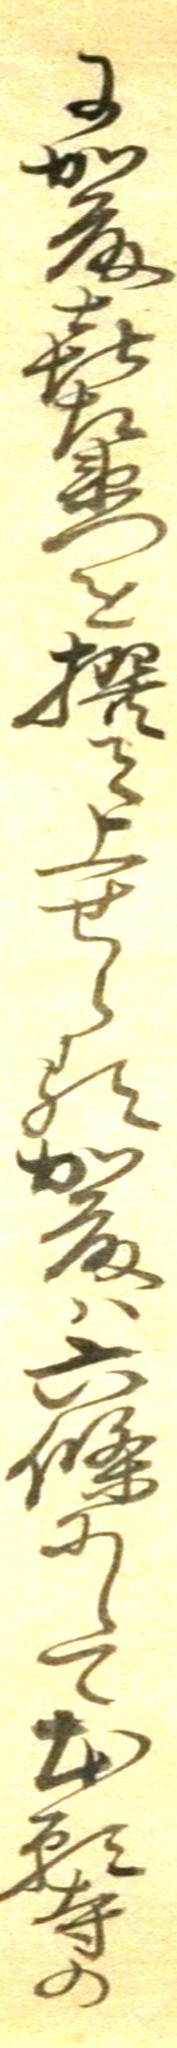に加藤喜左衛門を撰み上せらる加藤は六条にして本願寺の
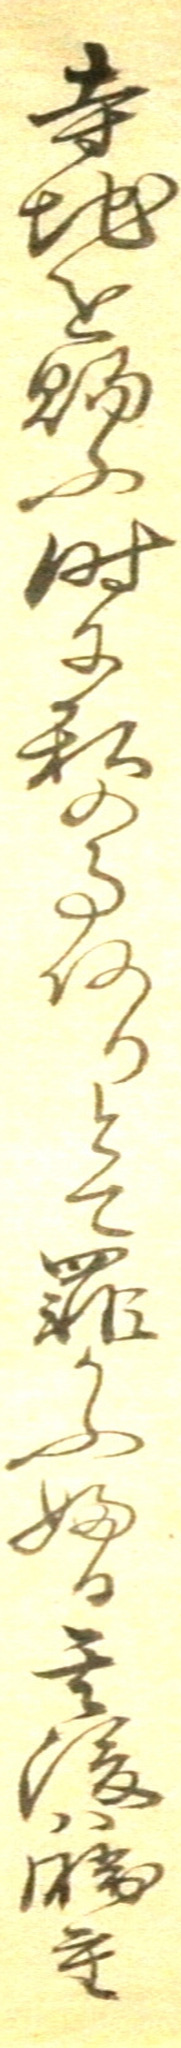寺地を賜ふ時に私の事ありとて罪かふふる其後は勝重
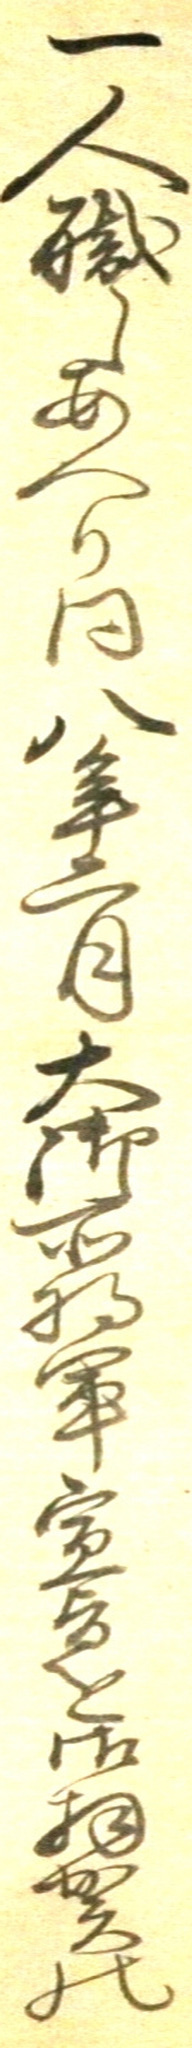一人職しあへり同八年二月大御所将軍宣旨を御拝賀の
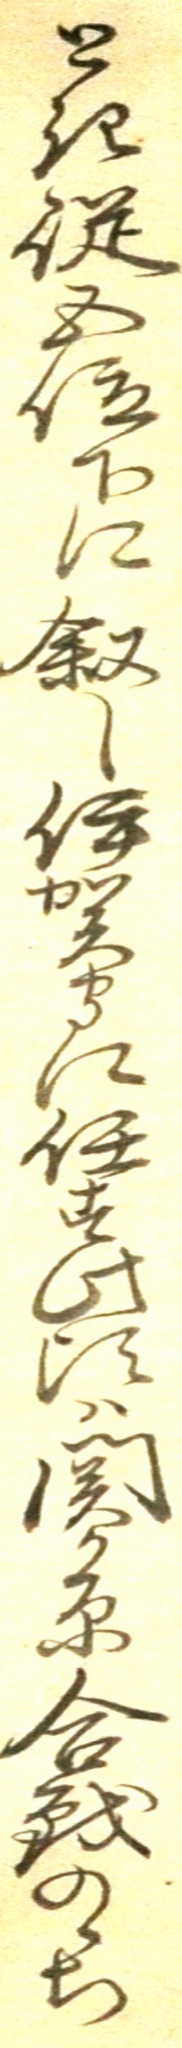とき従五位下に叙し伊賀守に任す此頃は関か原合戦のゝち
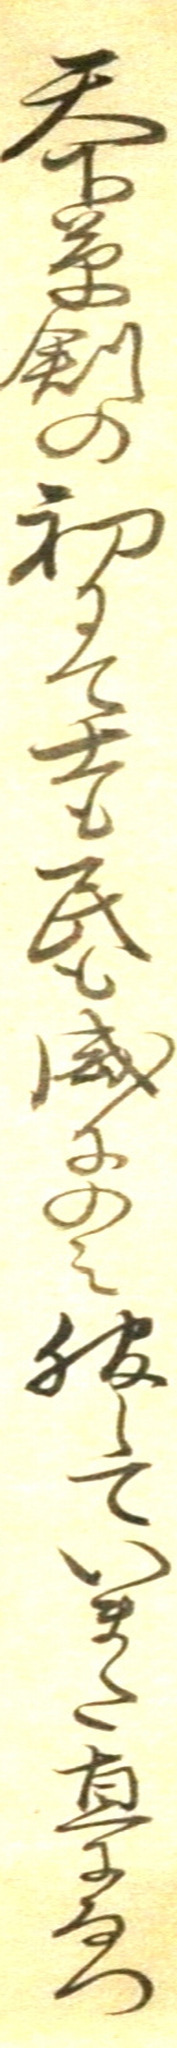天下草創の初にて士も民も威にのみ服していまた直になつ
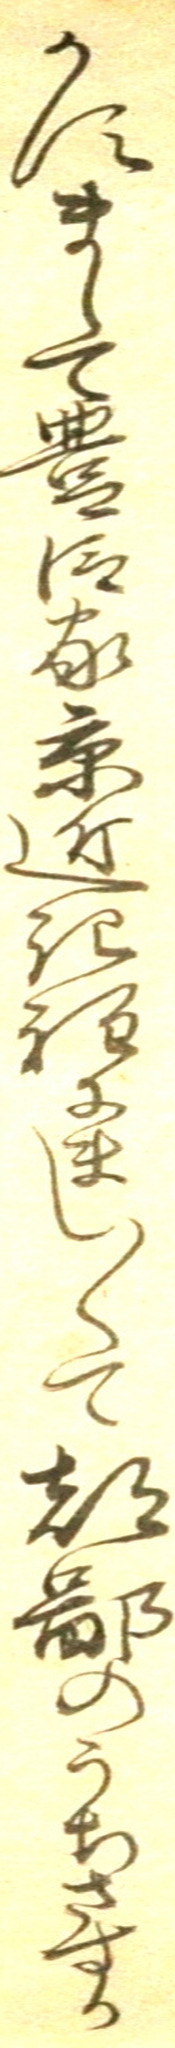かすまして豊臣家京近き程にまし〳〵て都鄙のうちさすか
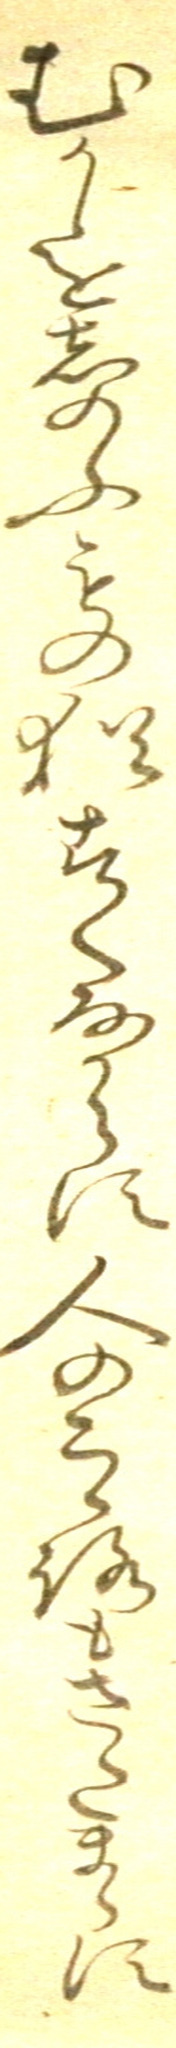むかしをしのふもの猶すくなからす人のこゝろもさたまらす
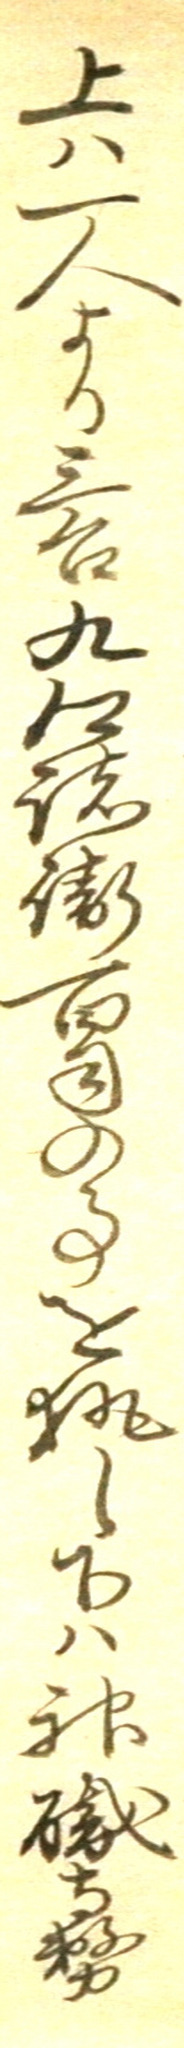上は一人より三台九卿諸衛百司の事を執し下は神職寺務
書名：藩翰譜（五）
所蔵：伊那市立高遠町図書館・合同会社AMANE
